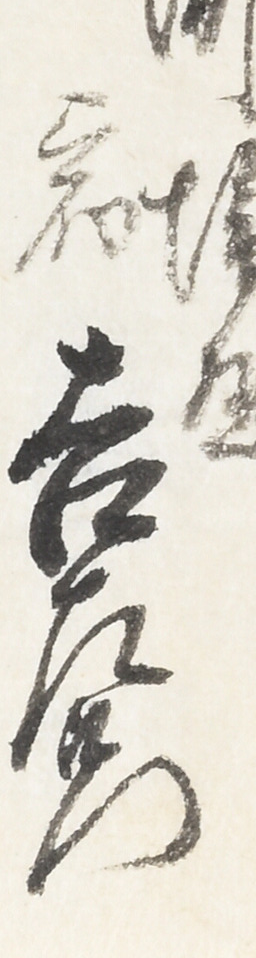宿吉左衛門
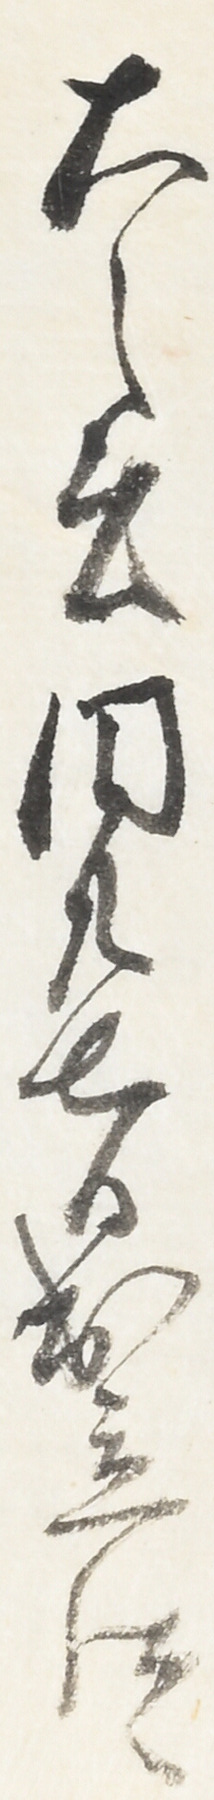右之者同廿七日出立仕候
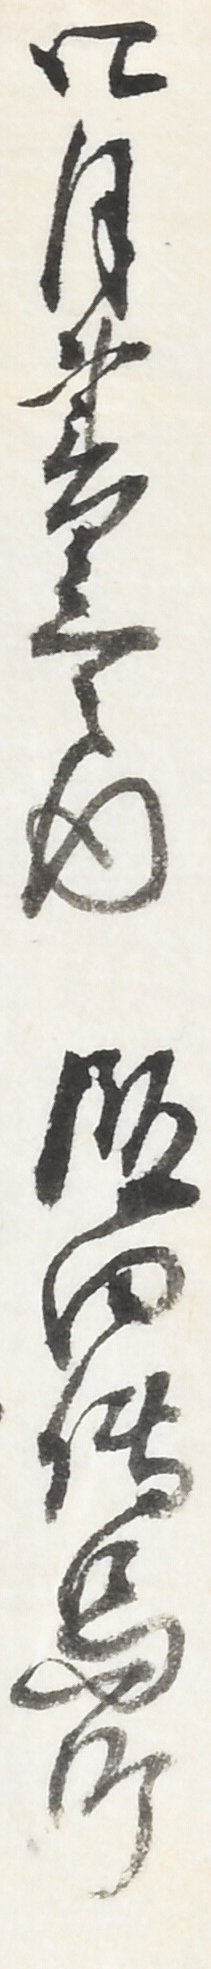四月書上之内飯田伝馬町
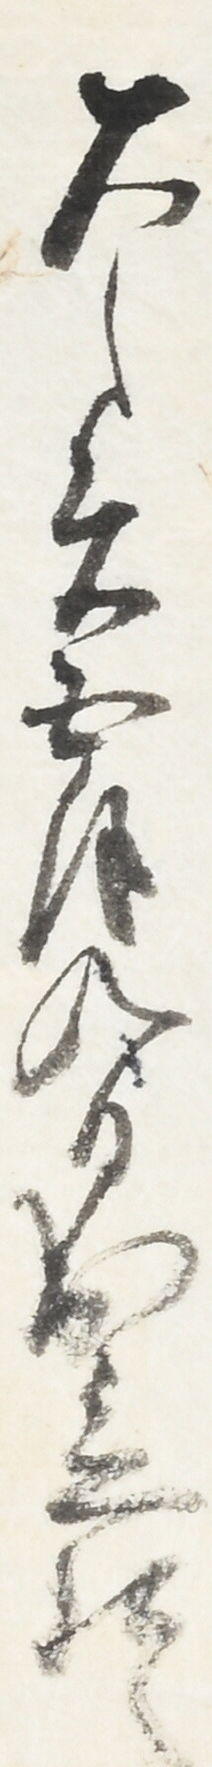右之者五月八日出立仕候

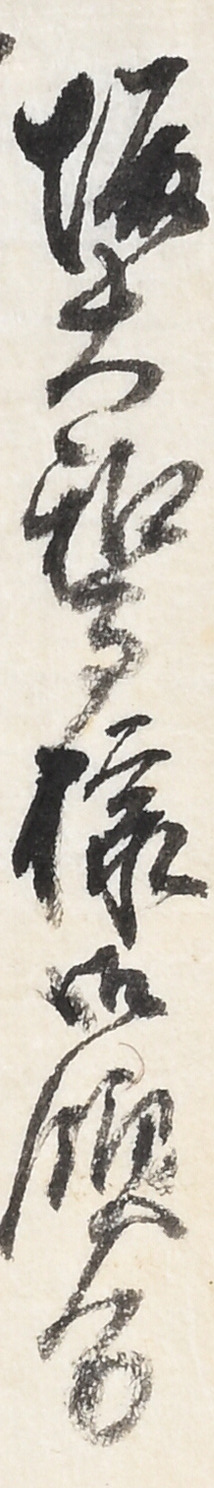堀大和守様御領分
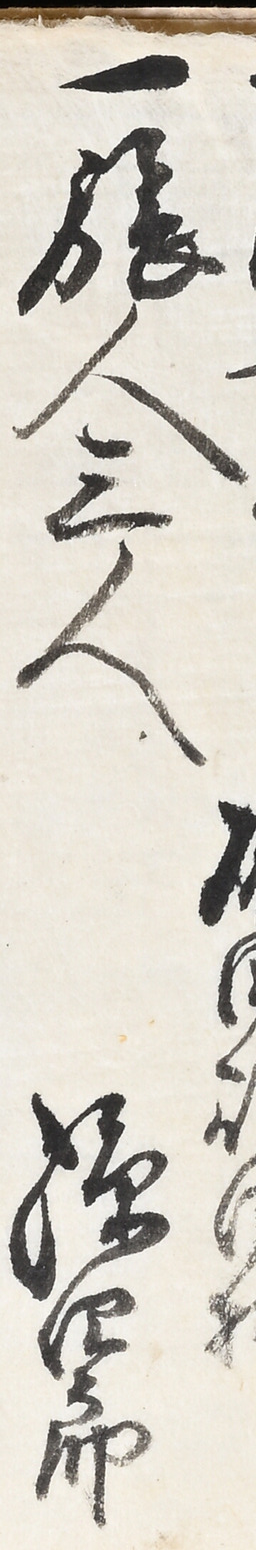一旅人三人孫四郎
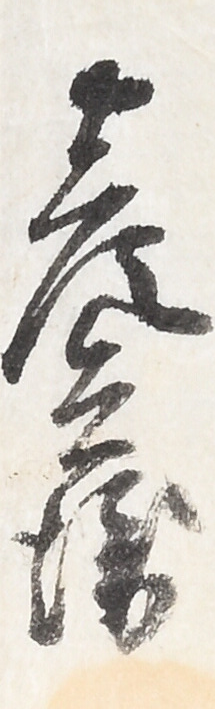彦兵衛
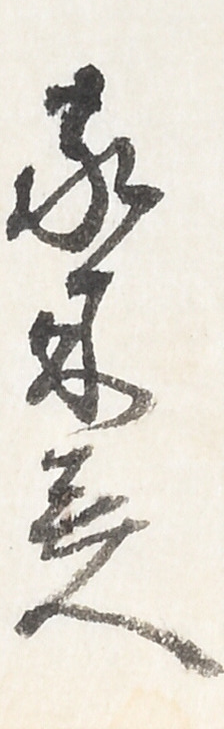家来壱人
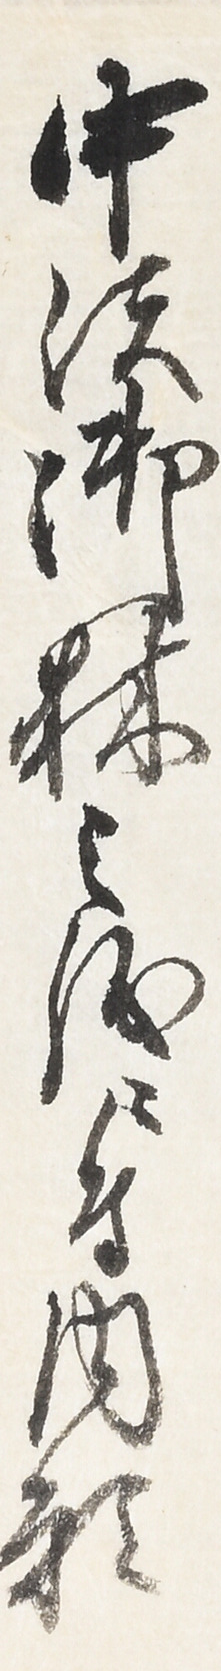中沢御林之儀ニ付内願
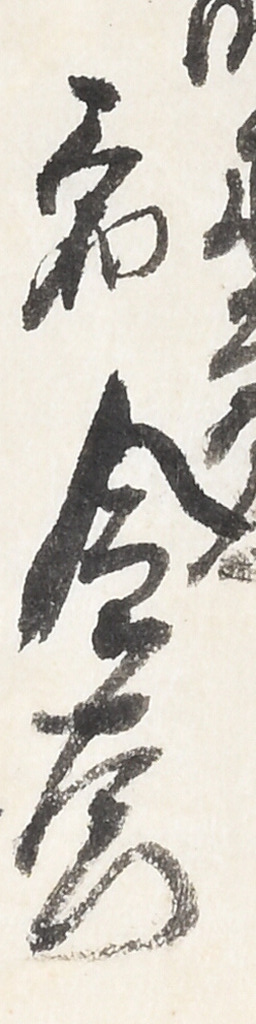宿金右衛門
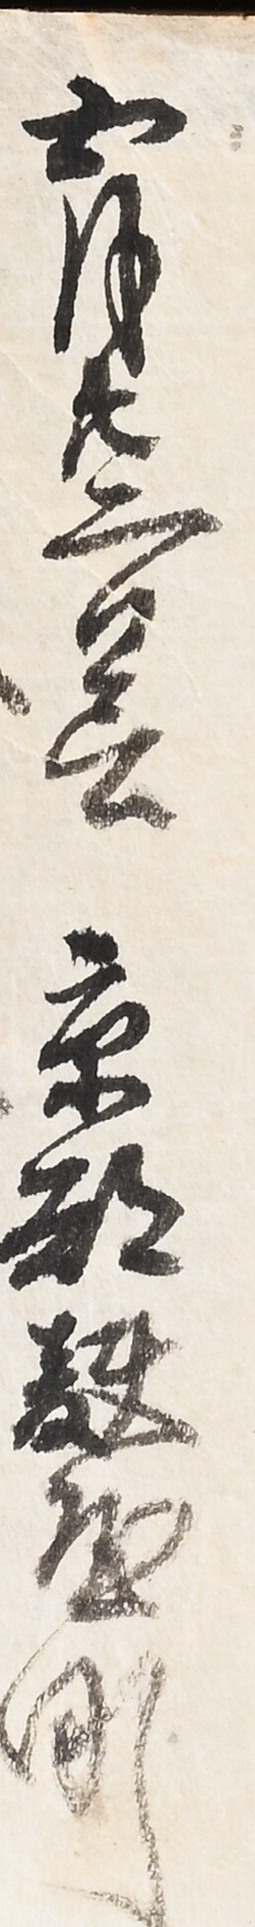五月廿二日着京都麩屋町
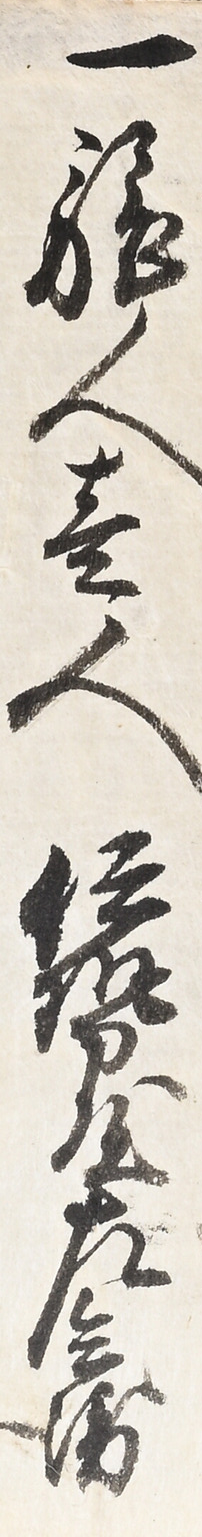一旅人壱人伊勢屋左兵衛
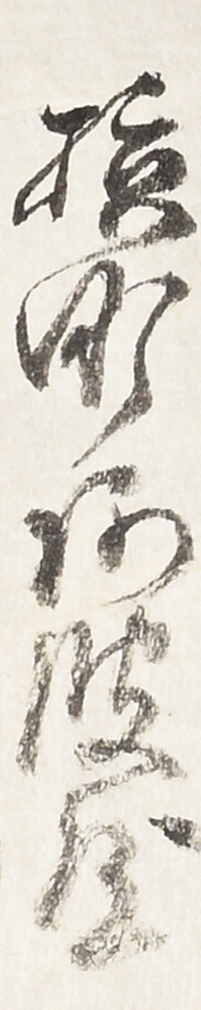横町阿波屋
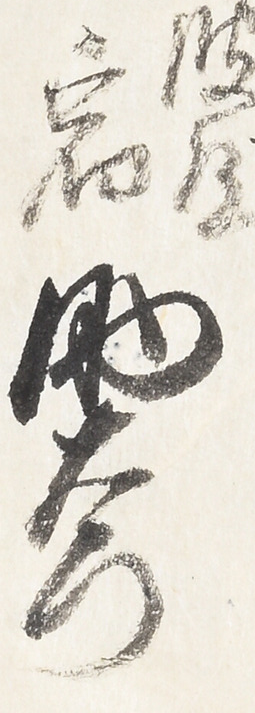宿助右衛門
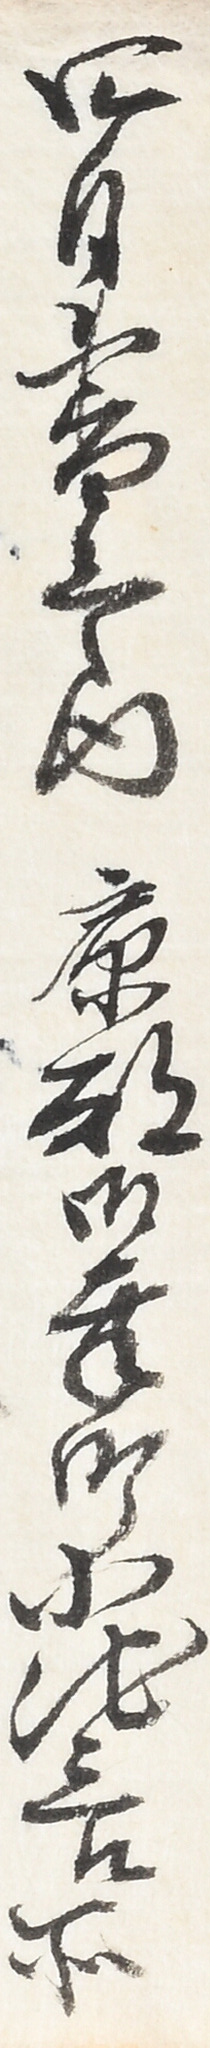四月書上之内京都御幸町小池上ル所
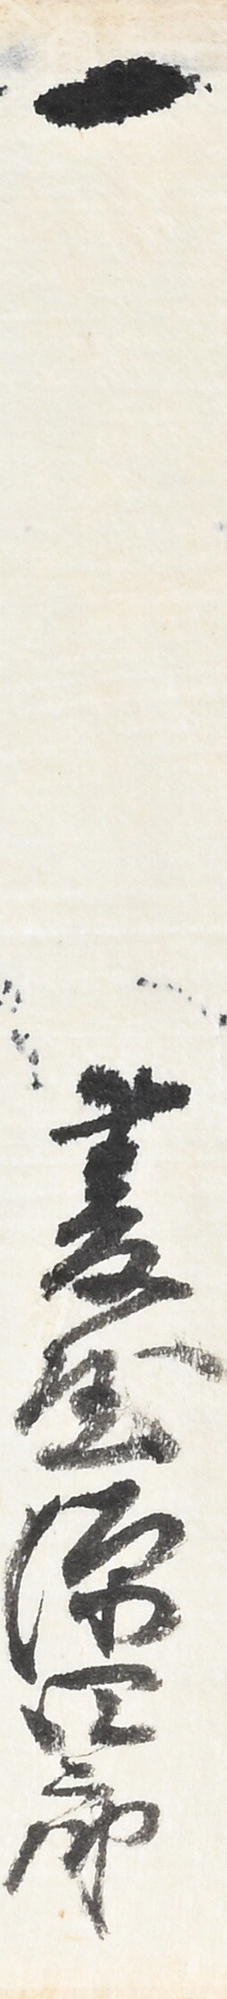一菱屋源四郎
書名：旅人泊控帳
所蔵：伊那市立高遠町図書館・合同会社AMANE
